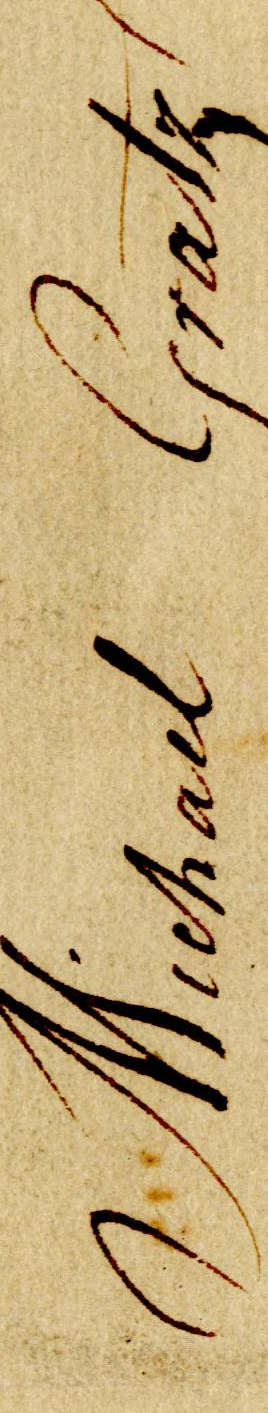Michael Gratz
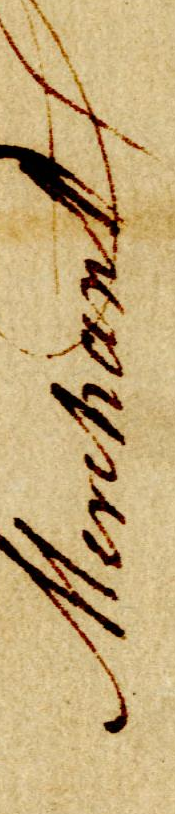Merchant
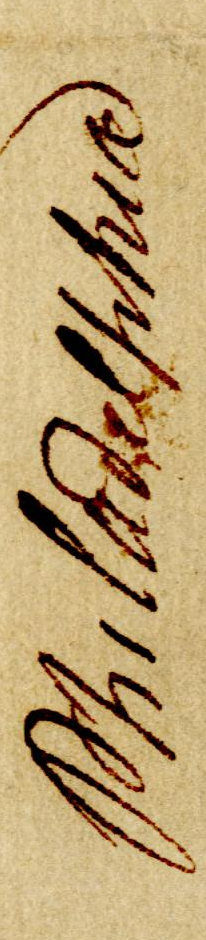Philadelphia
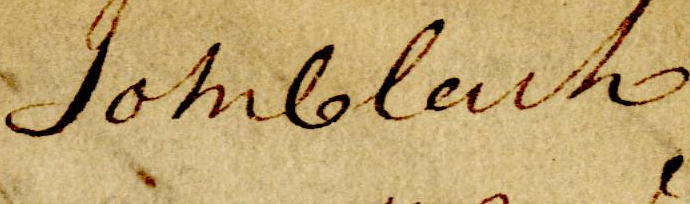John Clark
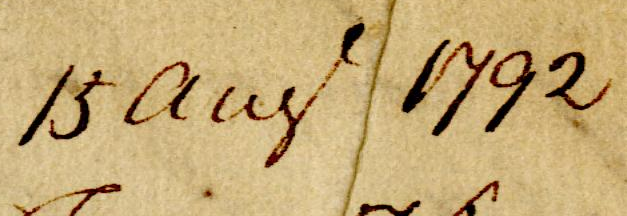15 Aug^t 1792
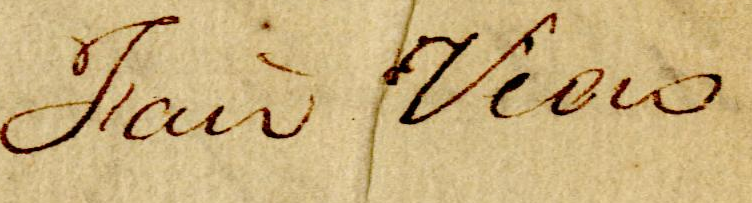Fair View
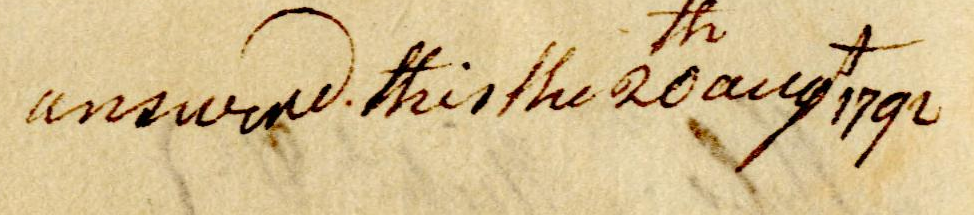answer^d this the 20^th Aug^t 1792
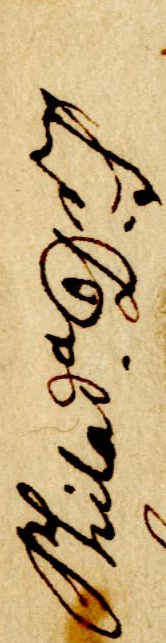Philad^a D^r S^r
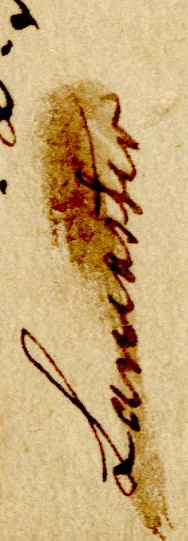Lancaster
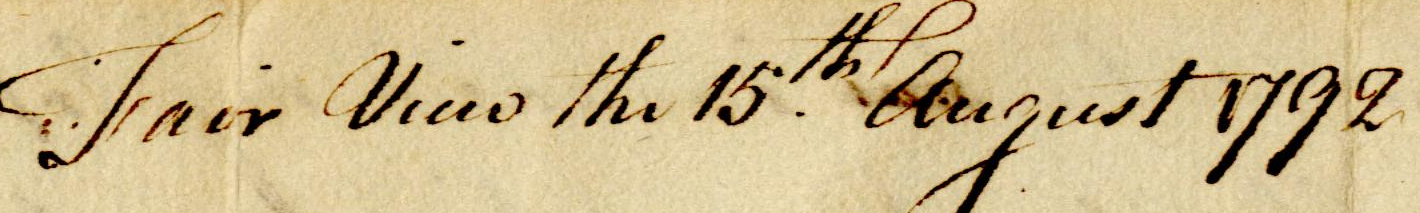Fair View the 15^th August 1792
